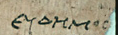ευδημοϲ
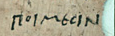ποιμεϲιν
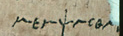μεμψαϲθαι
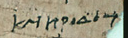καιηροδοτ
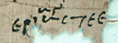ερι ϲτεε
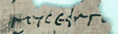μυϲεφηπ
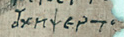χηψεντο
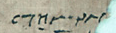ϲτημοναϲ
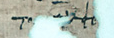το αφθ
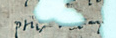ρη τ
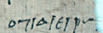οτιδιειρω
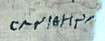ϲανιθηνα
